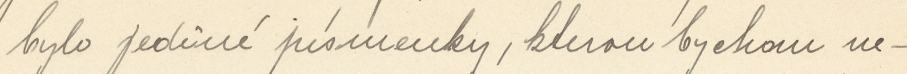bylo jediné písmenky, kterou bychom ne-
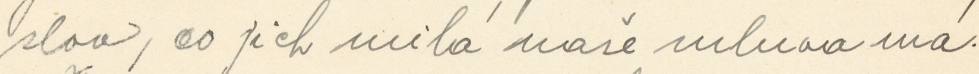slov, co jich milá naše mluva má.
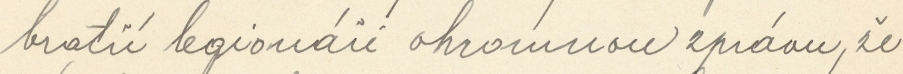bratří legionáři ohromnou zprávu, že
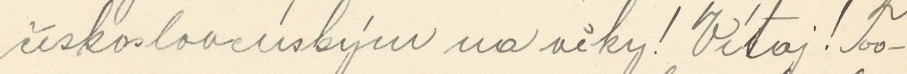československým na věky! Vítaj! Tvo-
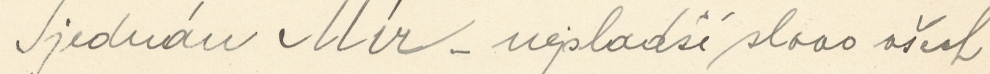Sjednán Mír - nejsladší slovo všech
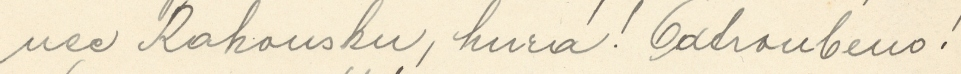nec Rakousku, hurá! Odtroubeno!
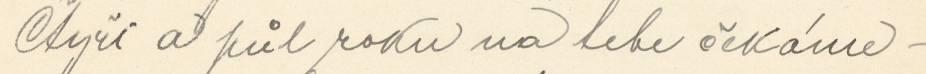Čtyři a půl roku na tebe čekáme -
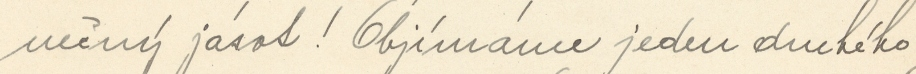nečný jásot! Objímáme jeden druhého
